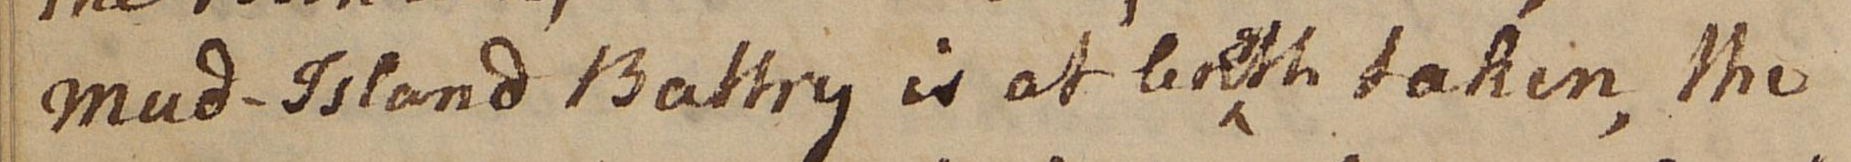Mud-Island Battry is at len^g th taken, the
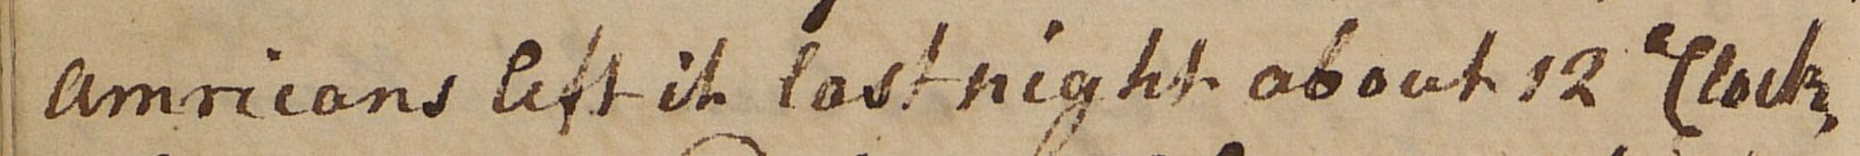Amricans left it last night about 12 oClock,
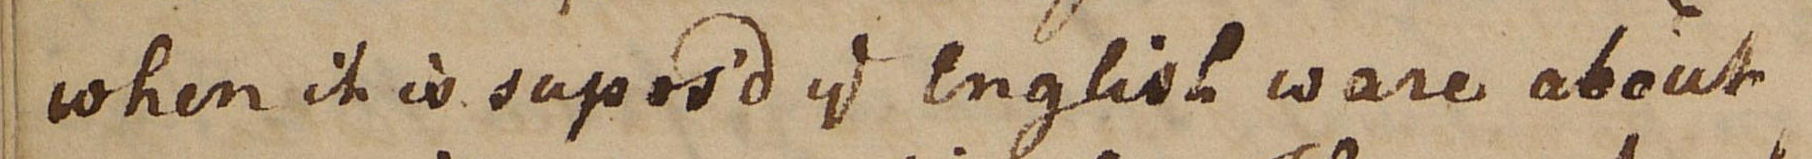when it is supos'd y^e English ware about
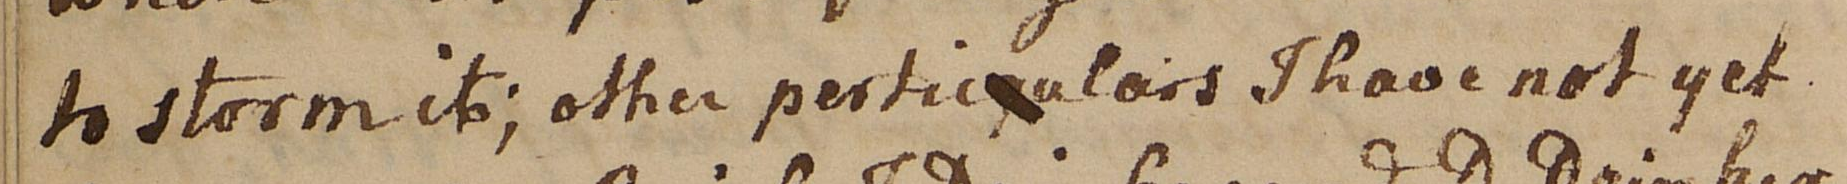to storm it; other pertic[q]ulars I have not yet
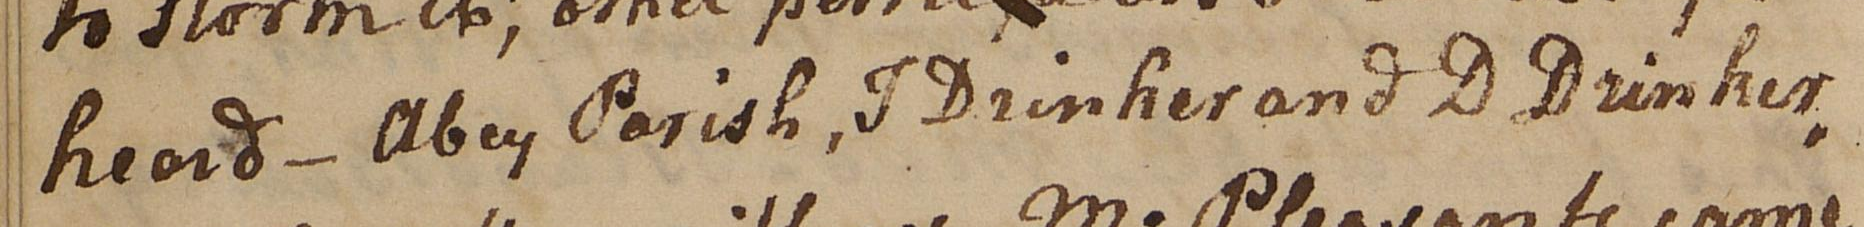heard- Abey Parish, J Drinker and D Drinker,
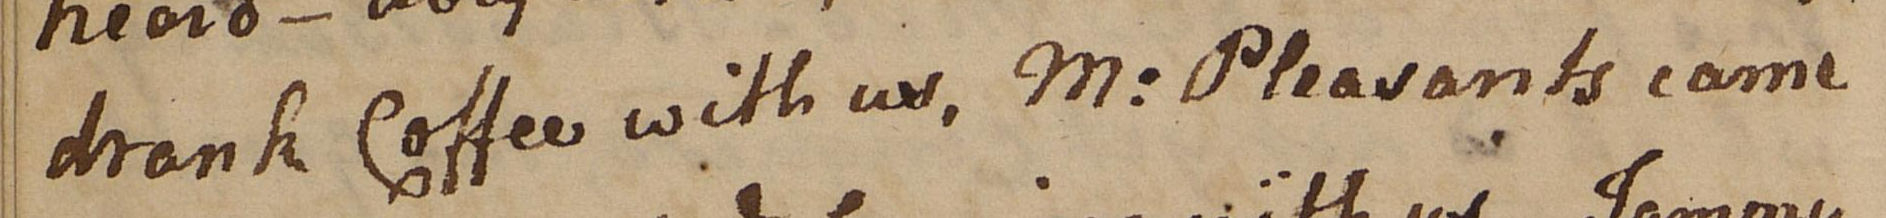drank Coffee with us, M: Pleasants came
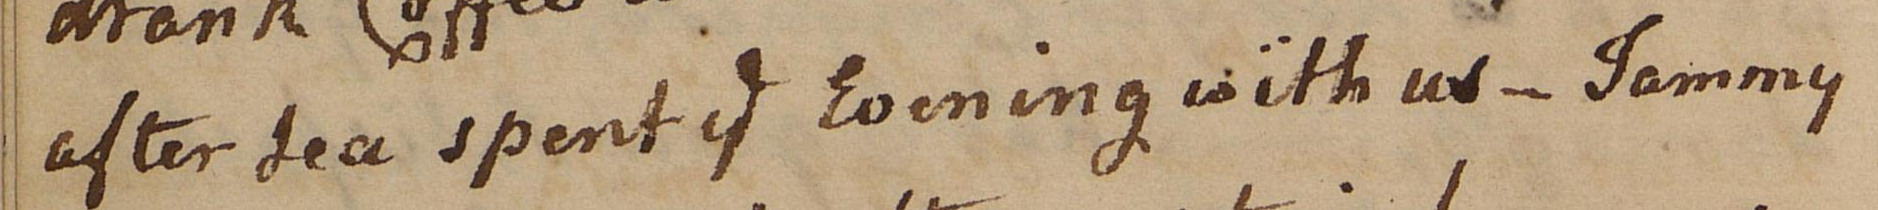after tea spent y^e Evening with us- Sammy
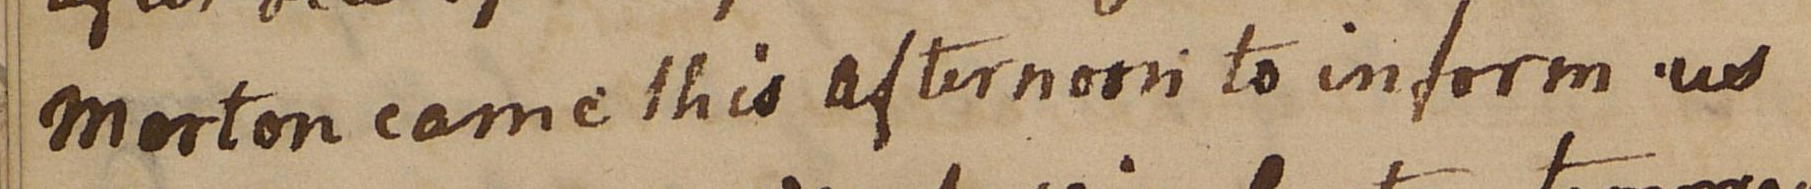Morton came this afternoon to inform us
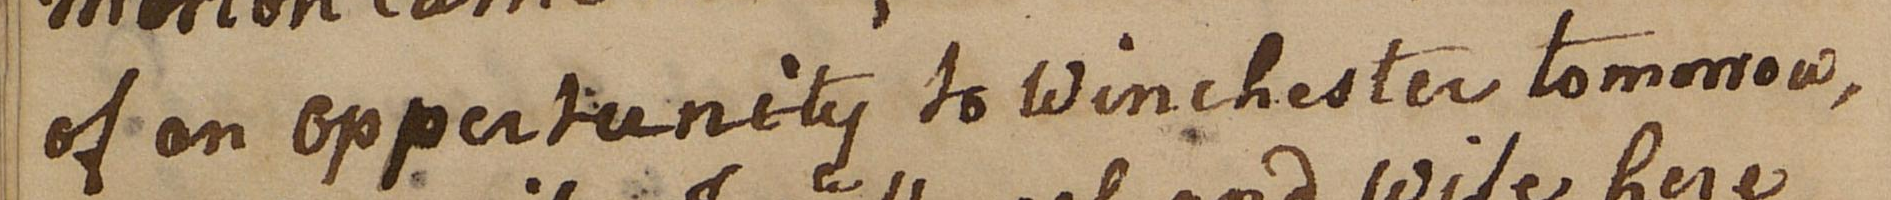of an oppertunity to Winchester tomorrow,
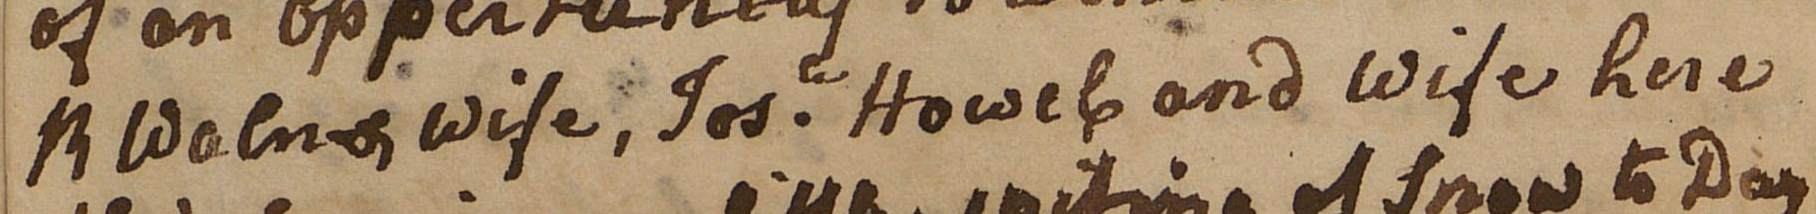R Waln & Wife, Jos^a. Howel and wife here
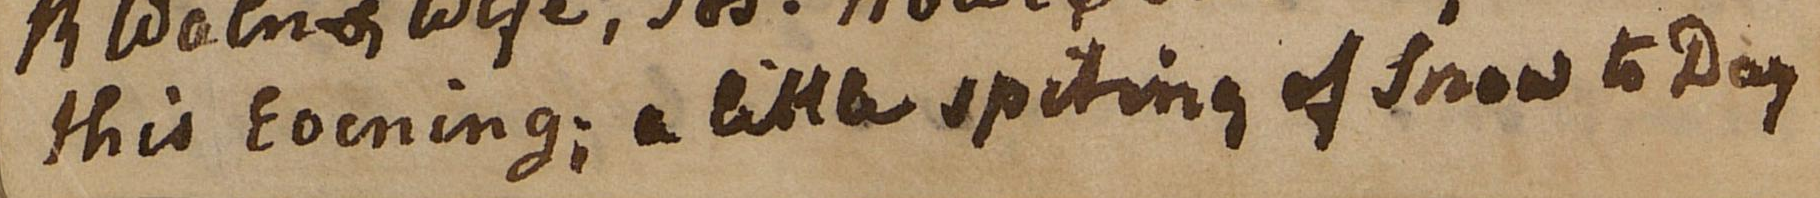this Evening; a little spiting of Snow to Day
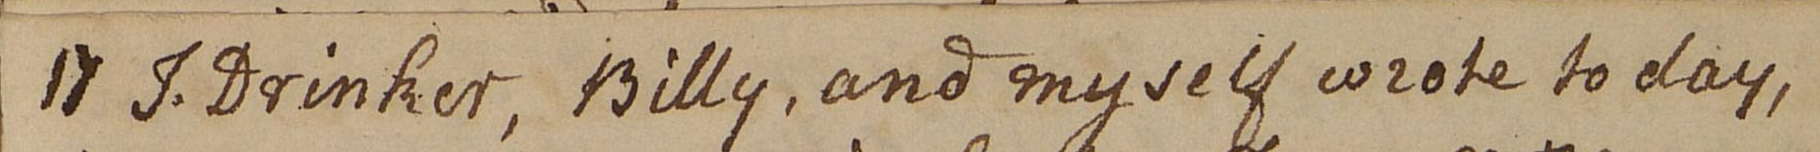17 J. Drinker, Billy, and myself wrote to day,
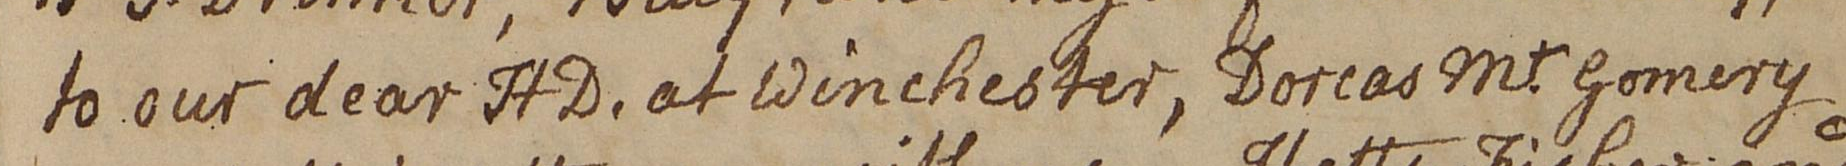to our dear HD, at Winchester, Dorcas M^r. Gomery
